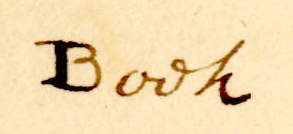Book
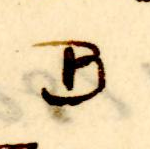B
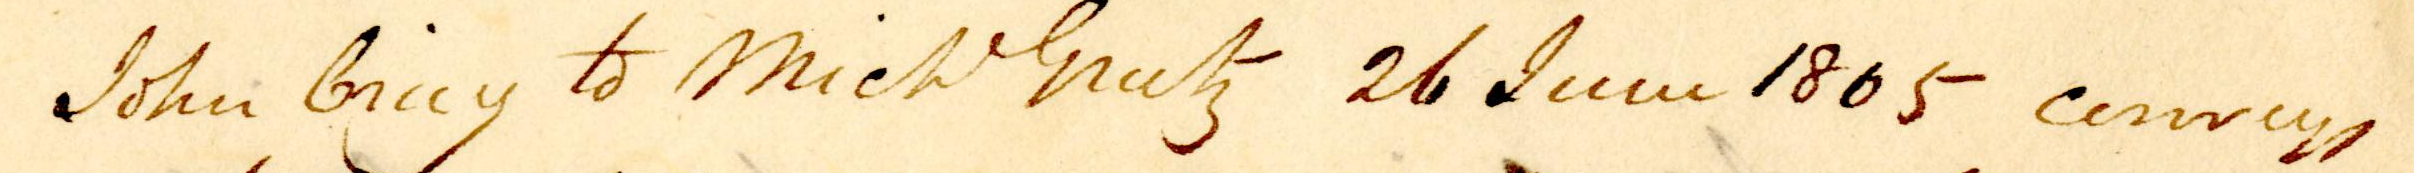John Grey to Mich^l Gratz 26 June 1805 carrys
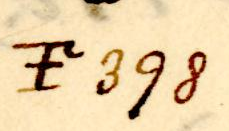F 398
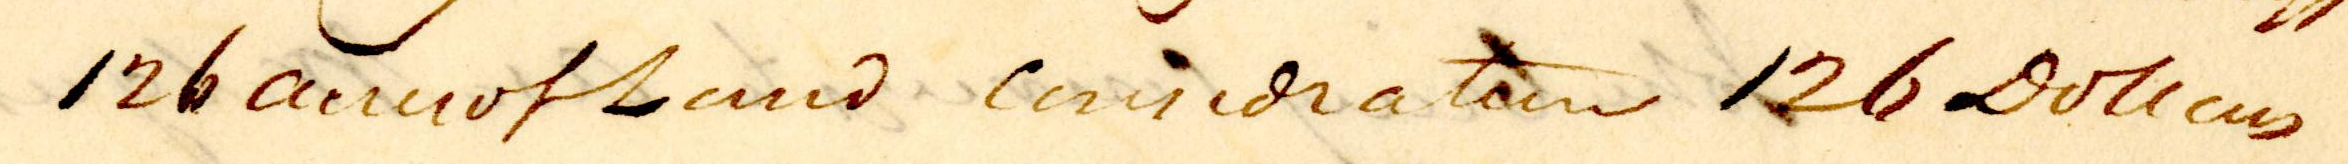126 acres of Land consideration 126 Dollars
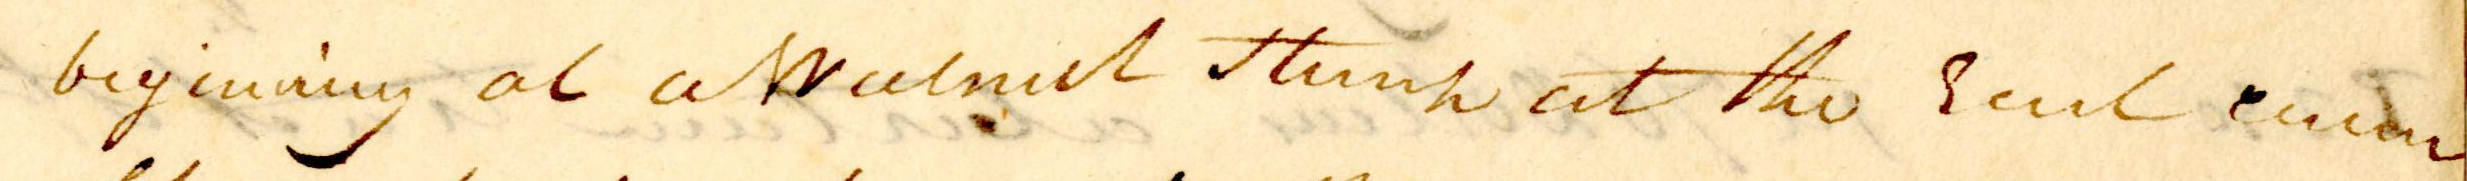beggining at a Walnut stump at the East union
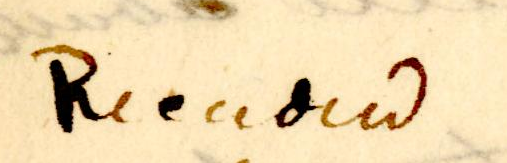Received
